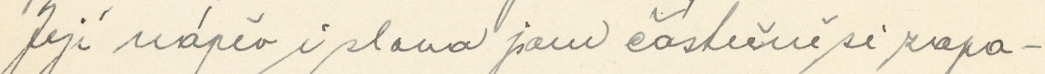Její nápěv i slova jsem částečně si zapa-
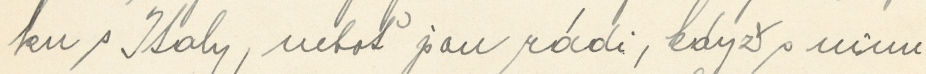ku s Italy, neboť jsou rádi, když s nimi
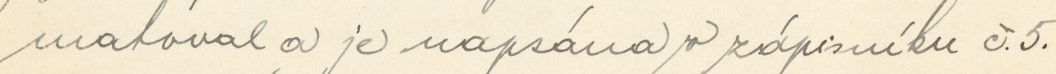matoval a je napsána v zápisníku č. 5.
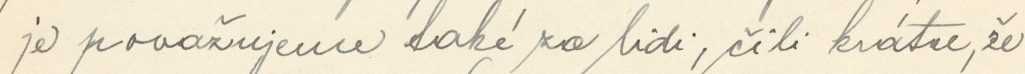je považujeme také za lidi, čili krátce, že
